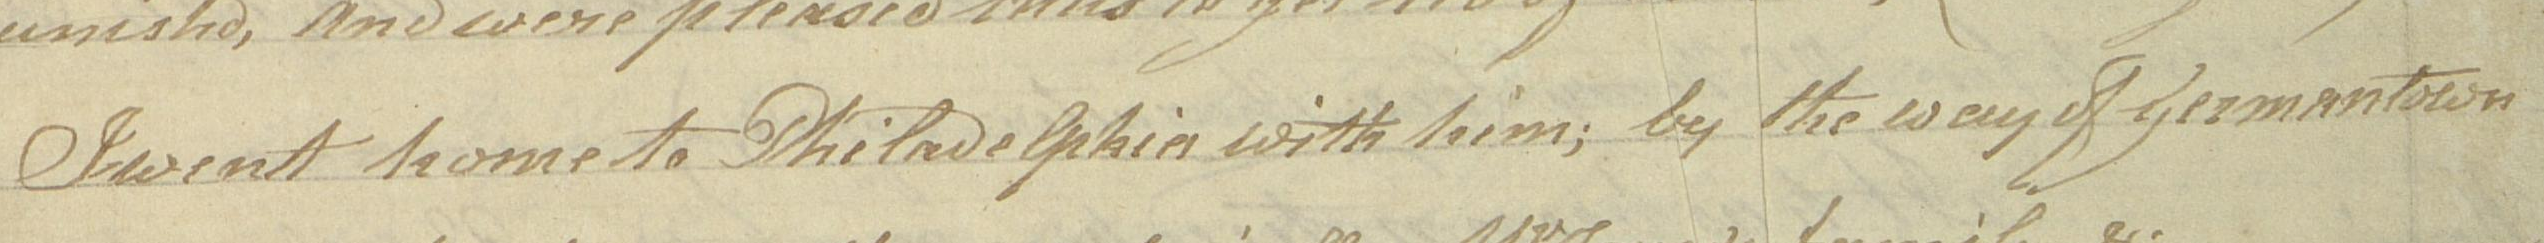I went home to Philadelphia with him; by the way of Germantown
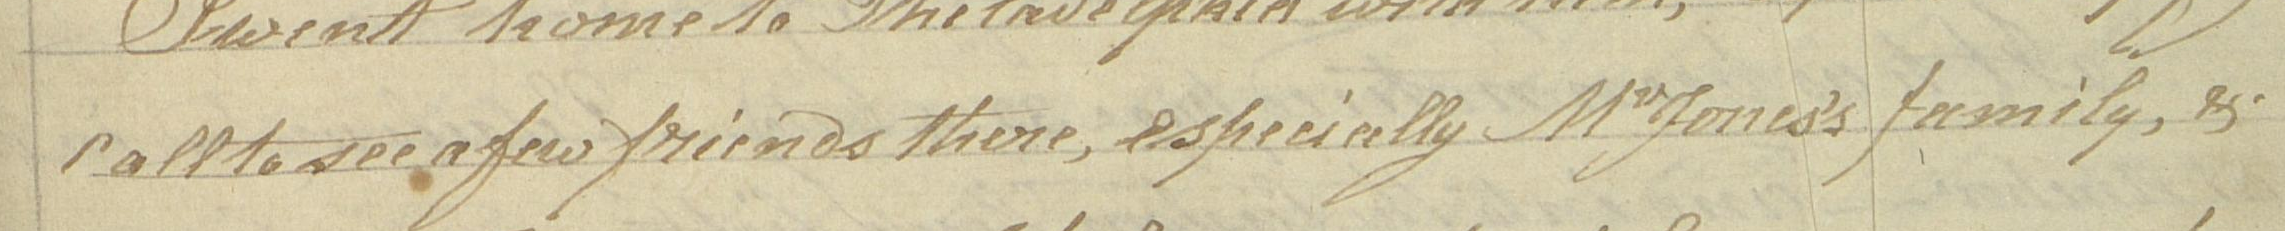call to see a few friends there, especially M^rJones's family, &
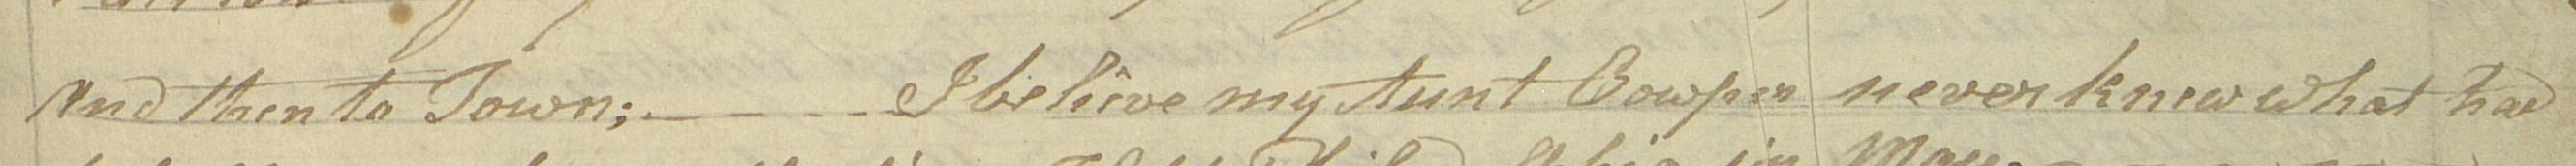and then to Town; I believe my tunt Bowper never knew what had
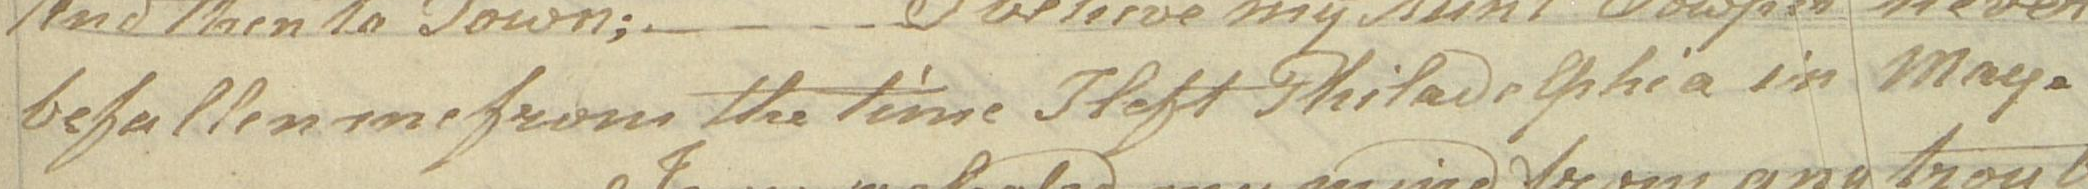befallen me from the time I left Philadelphia in May.
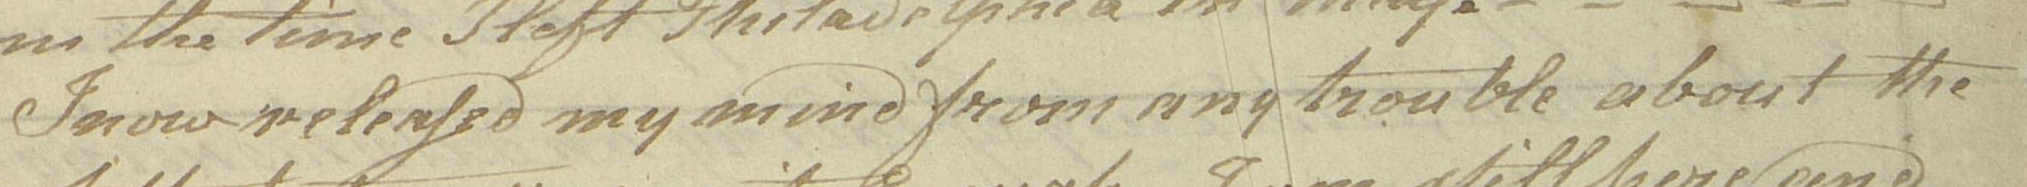I now released my mind from any trouble about the
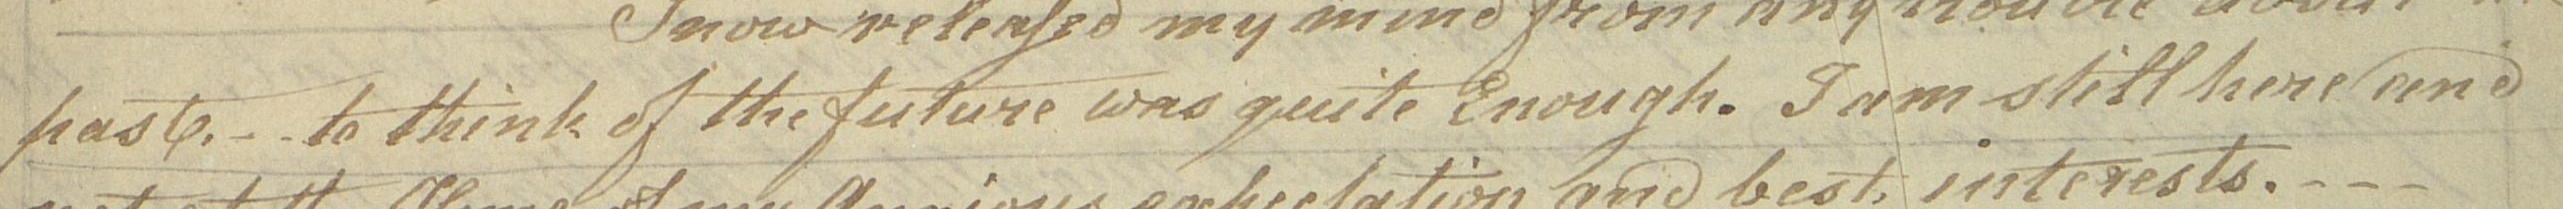past. to think of the future was quite Enough. I am still here and
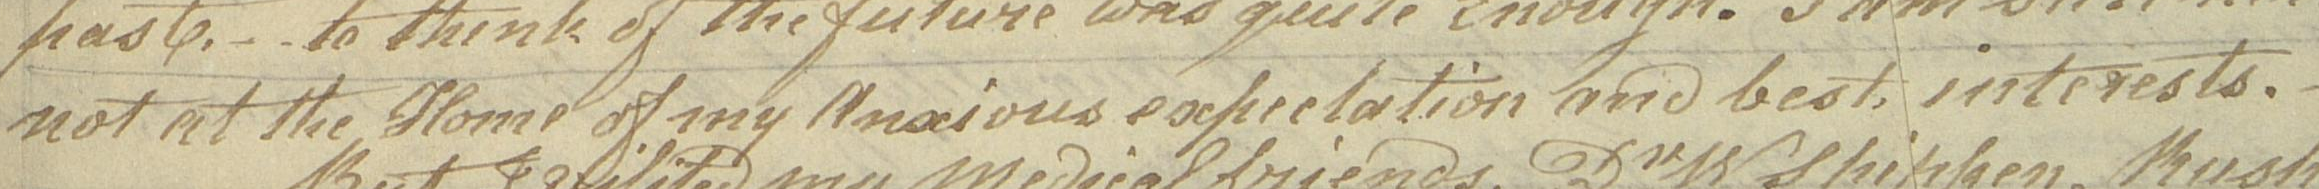not at the Home of my Anxious expectation and best interests.
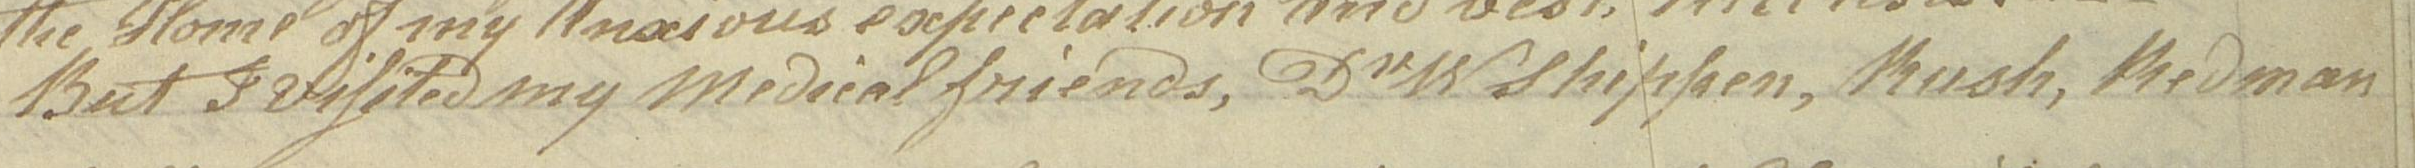But I visited my Medical friends, D^r W Shippen, Rush, Redman
